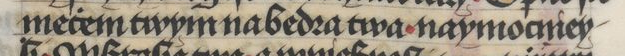meċem twym nabedra twa.naymocniey¬
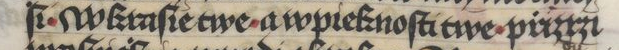ẛí.Wkraſie twe.a wpieknoſti twe.pṙizrzi
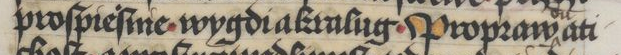proſpieẛnie.wygdi a kralug.Proprawouati¬
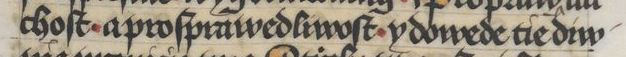choſt.a proſprawedliwoſt.y dowede tie diw¬
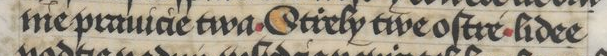nie prauicie twa.Stṙely twe oſtré.lidee
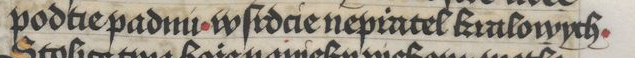podtie padnú.w ſrdcie nepṙatel kralowych.
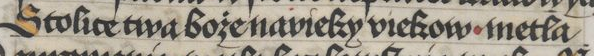Stolice twa boże navieky viekow.metla
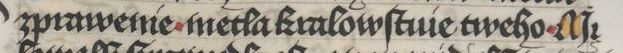zpraweníe.metla kralowſtuíe tweho.Mi¬
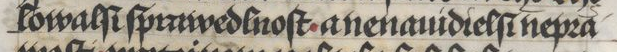lowalſi ſprawedlnoſt.a nenauidielſi nepra¬
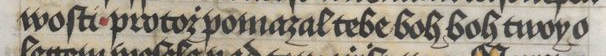woſti.protoż pomazal tebe boh boh twoy o¬
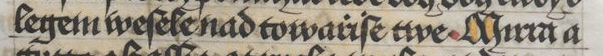legem weſele nad towařiẛe twe.Mirra a
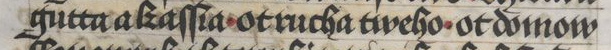gutta a kaſſia.ot rucha tweho.ot domow
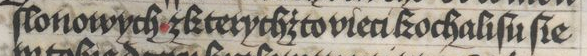ſlonowych zkterychżto viecí kochaliſu ſie
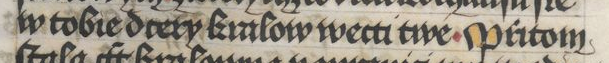w tobie dcery kralow wecti twé.Pṙitom
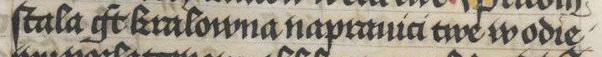ſtala ḡt kralowna naprauici twe w odie¬
